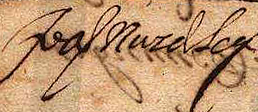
Joaõ nuz d Leaõ
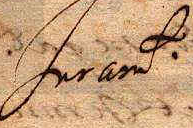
Juramto.
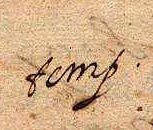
temp.
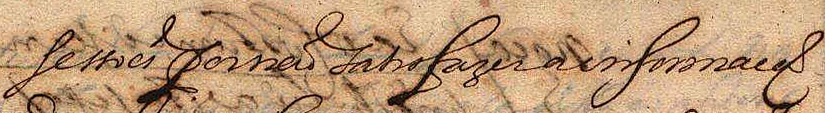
sessoẽs por naõ satisfazer a informaçaõ
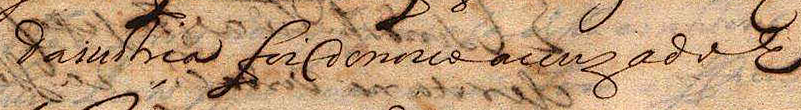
da iustiça foi de nouo accuzado E
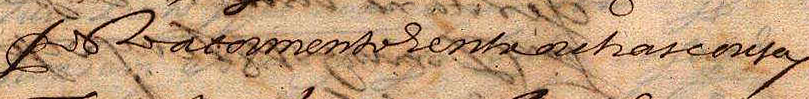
posto a tormento E entre outras cousas
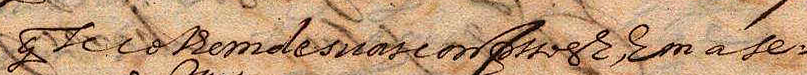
q̄ se cothem de suas confissoes, Em a se
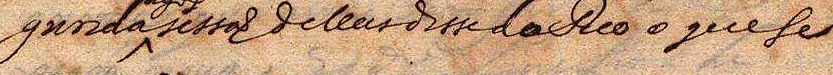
gunda sessaõ dellas disse do Reo o que se
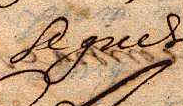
segue
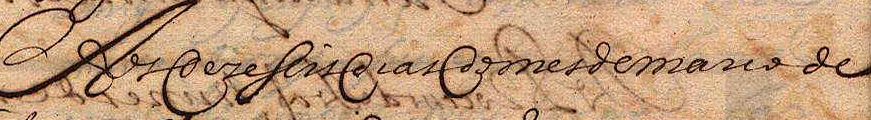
Aos dezeseis dias do mes de março de
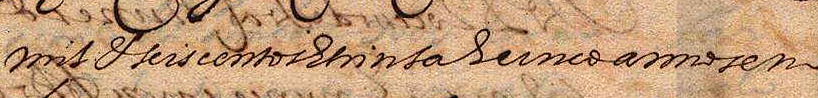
mil & seiscentos E trinta E cinco annos em
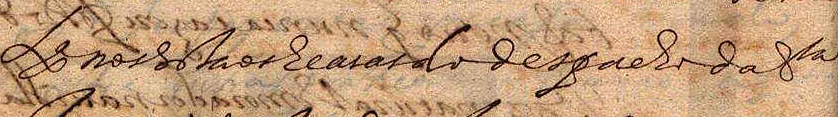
Lxa nos Estaos E casas do despacho da Sta
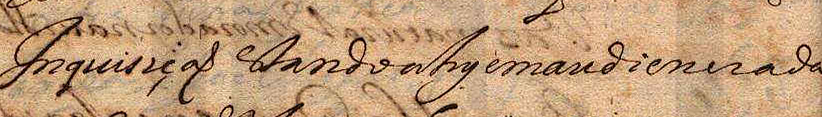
Jnquisiçaõ estando ahy em audiencia da
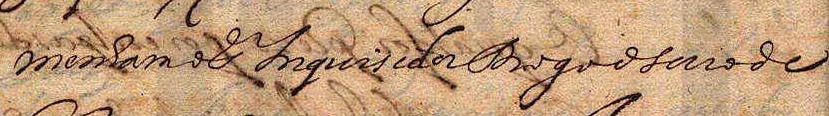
menham o sor Inquisidor Diogo osorio de
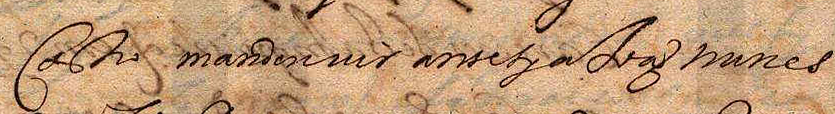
Castro mandou uir ante sy a Joaõ nunes
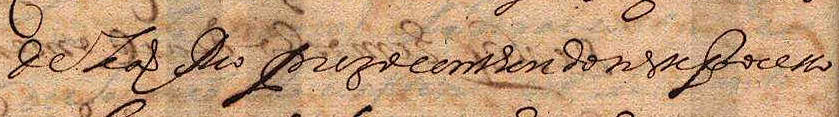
de Leaõ Reo prezo contheudo neste processo
